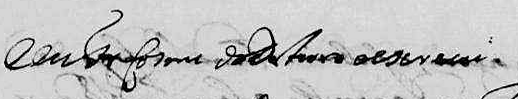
e eu Fr Cosme do Desterro o escreui.
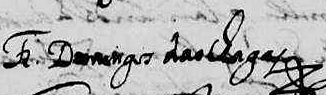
Fr. Domigos das chagas
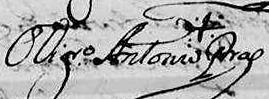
O Vigr.o Antonio Pra
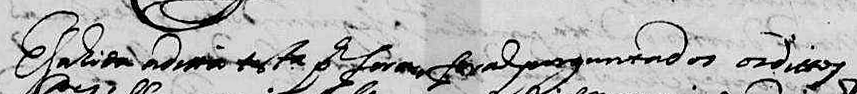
E sahida a ditta test.a pa fora foraõ perguntados os dittos
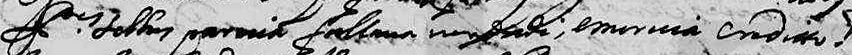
Pe.s se lhes parecia fallaua uerdade; e merecia creditto?
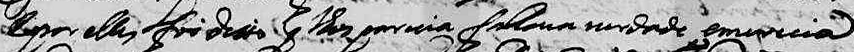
e por elles foi ditto q̄ lhes parecia fallaua uerdade e merecia
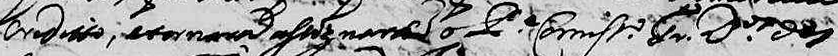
creditto, e tornarā assignaraõ o P.e Comisr.o Fr. D.os das
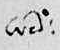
credo:
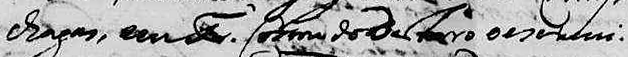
chagas, e eu Fr. Cosme do Desterro o escreui.
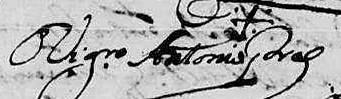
O Vigro Antonio Pra
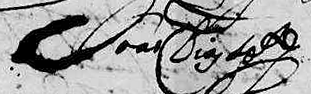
Joaõ Dias d sto
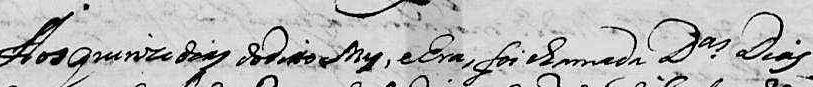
Aos quinze dias do ditto Mes, e Era, foi chamada Das. Dias
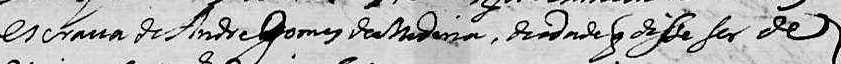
escraua de Andre Gomes de Medina, de idade q̄ disse ser de
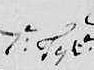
7.a Test.a
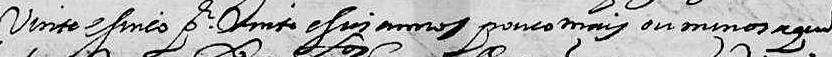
Vinte e sinco p.a vinte e seis annos pouco mais ou menos a quē
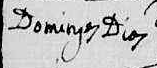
Domingas Dias
